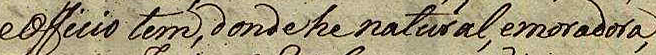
e Officio tem, donde he natural, e moradora,
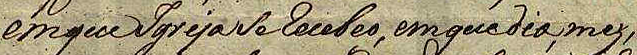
em que Igreja se Recebeo, em que dia, mez,
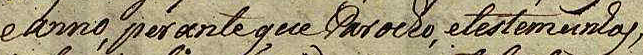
e anno, perante que Parocho, e testemunhas,
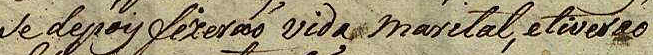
se depois fizeraõ vida marital, e tiveraõ
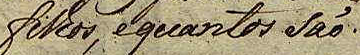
filhos, e quantos saõ.
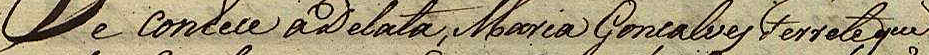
Se conhece a Delata, Maria Gonçalves Ferrete, que
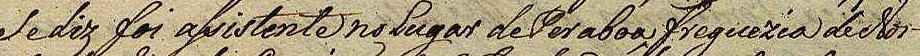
se diz foi assistente no Lugar de Peraboa, freguezia de Nos
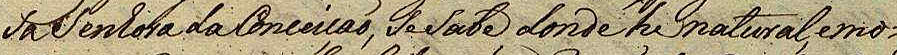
sa Senhora da Conceiçaõ, se sabe donde he natural, e mo
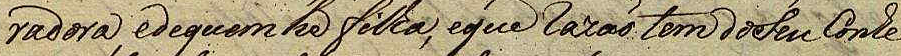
radora, e de quem he filha, e que Razaõ tem do seu conhe
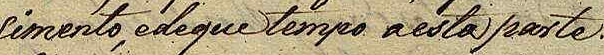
cimento, e de que tempo a esta parte
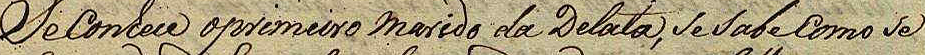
Se conhece o primeiro marido da Delata, se sabe como se
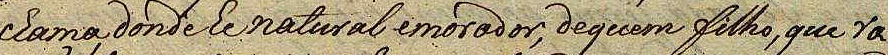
chama, donde he natural e morador, de quem filho, que ra
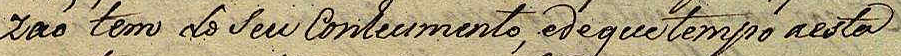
zaõ tem do seu conhecimento, e de que tempo a esta
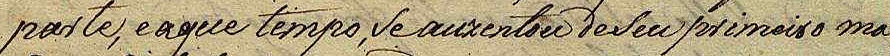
parte, e a que tempo, se auzentou do seu primeiro ma
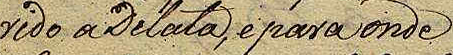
rido a Delata, e para onde
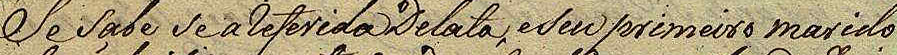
Se sabe se a Referida Delata, e seu primeiro marido
